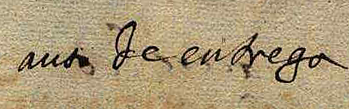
auto de entrega
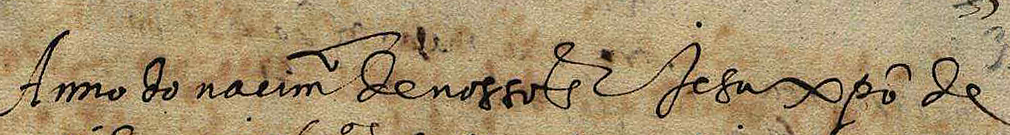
Anno do nacimto de nosso sor Jesu xpō de
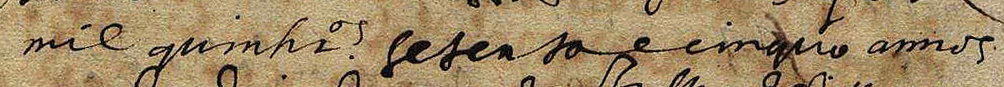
mil quinhtos. setenta e cinquo annos
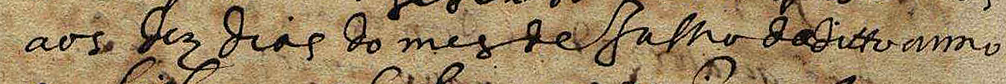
aos dez dias do mes de Julho do ditto anno
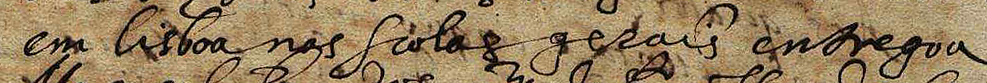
em lisboa nas scolas geraīs entregou
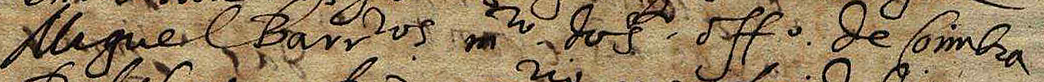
Miguel Barrros mro. do sto. offo. de Coimbra
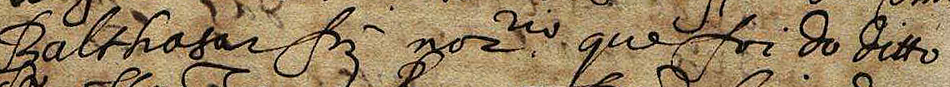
Balthasar frz̄ not.rio que foi do ditto
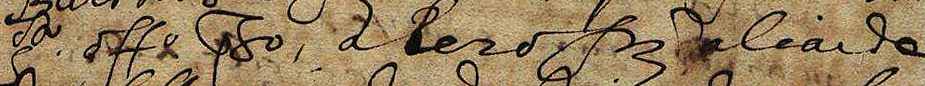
Sto. offo. p̄so, a Pero frz̄ alcaide
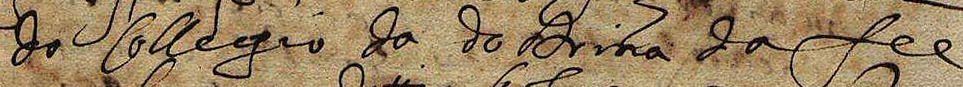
do Collegio da doctrina da fee
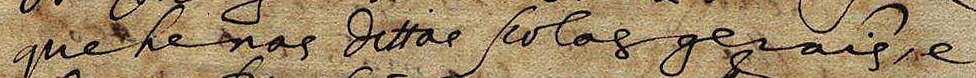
que he nas dittas scolas geraīs, e
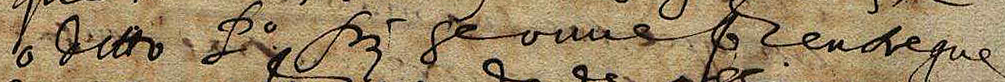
o ditto Po. frz̄ se ouue por entregue
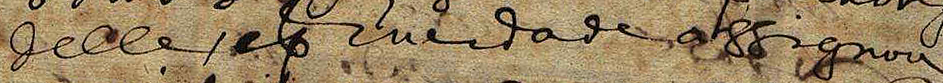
delle / e por uerdade assignou
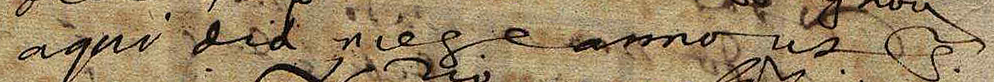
aqui dia mes e anno ut s̄.
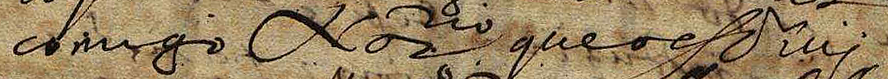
comigo Notrio. que o esc̄iuy
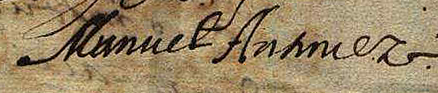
Manuel Antunez
